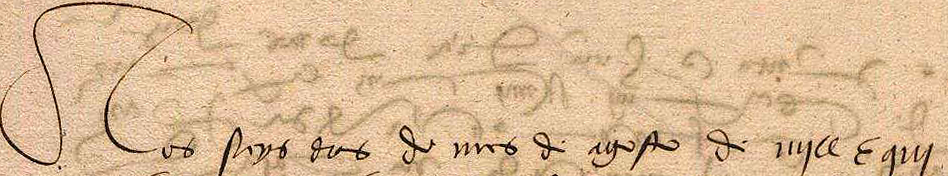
Aos seys dias do mes de agosto de mjll E quj
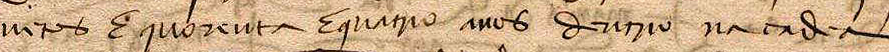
netos E quorenta E quatro anos dentro na cadea
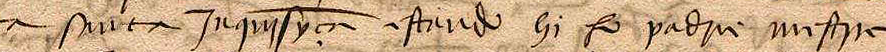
da santa Jnqūjsyça estando hi ho padre mestre
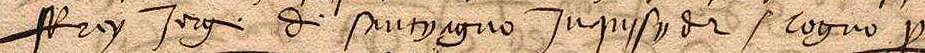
ffrey Jorge de santyaguo Jnqujsydor / loguo ꝑ
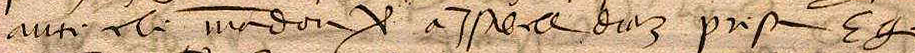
ante ele m̄adou ꝟ a Jsabell diaz presa E lhe
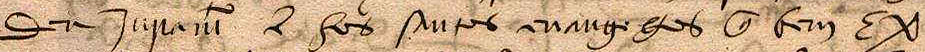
deu Juramto ē hos santos euangelhos q̄ bem E ꝟ
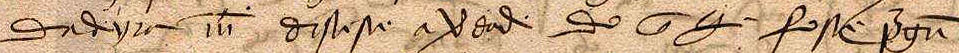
dadeyramte disese a ꝟdade do q̄ lhe fose p̄gū
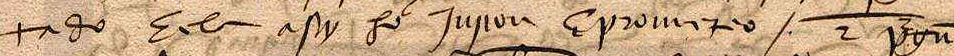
tado E ela asy ho Jurou E prometeo /. item p̄gū
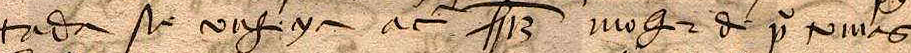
tada se conhecya a ca f̄rrz molher de po tomas
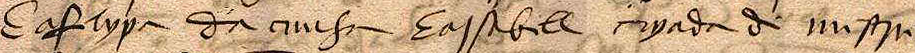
E a felypa da cunha E a jsabell cryada de mestre
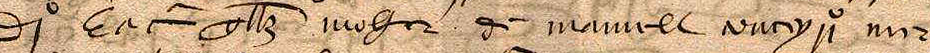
djo E a ca ḡllz molher de manuell couceyro mer
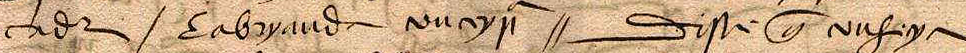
cador / E a bryanda couceyra // dise q̄ conhecya
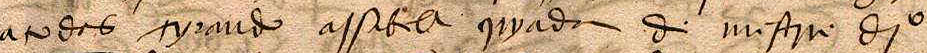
a todas tyrando a jsabell cryada de mestre djo
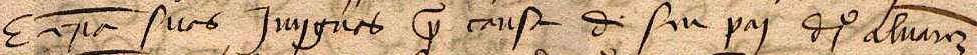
E ēra suas Jmjguas p̄o causa de seu paj djo aluarez
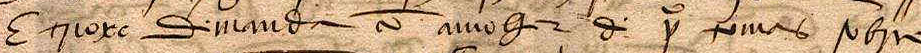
E troxe demanda c̄o a molher de po tomas sobre
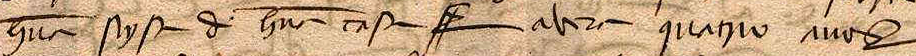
h̄ua sysa de h̄ua casa E avera quatro anos
